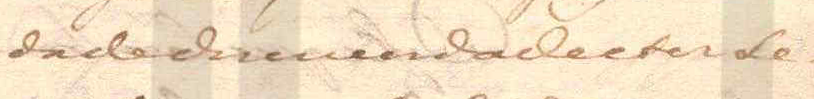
dado dizer verdade e ter se
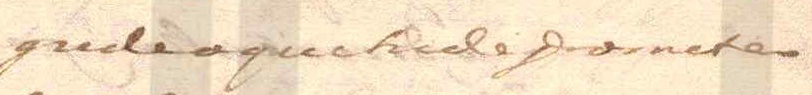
gredo o que tudo prometeo
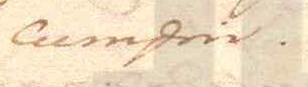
cumprir.
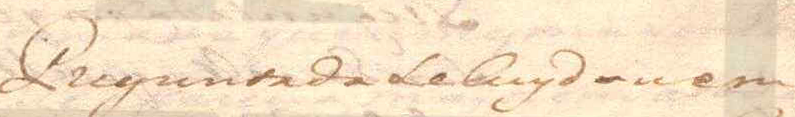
Preguntada se Cuydou em
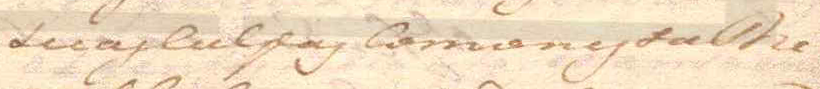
suas culpas como nesta Me
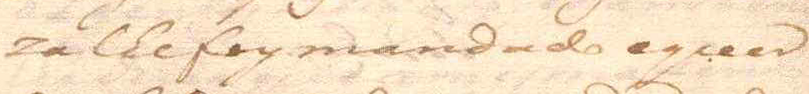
za lhe foy mandado e quer
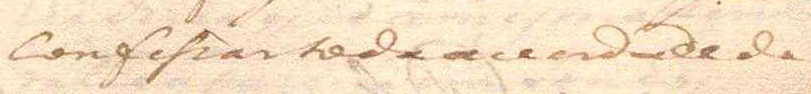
confessar toda a verdade de
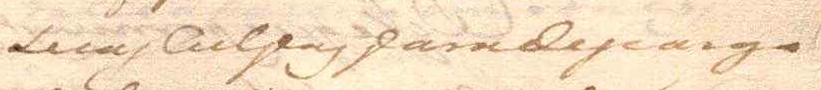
suas culpas para descargo
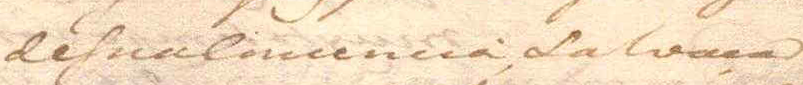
de sua conciencia, salvaçã
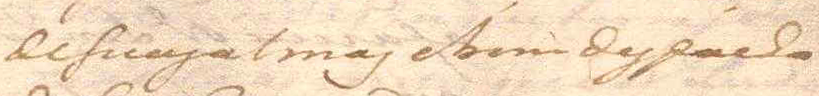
de suas almas e bom despacho
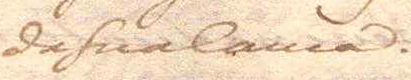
da sua Cauza.
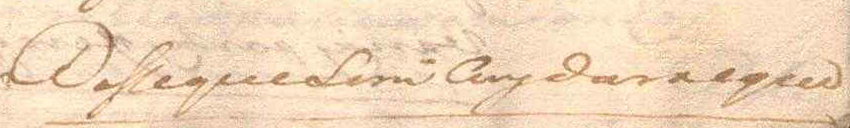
Disse que sim cuydara e que
